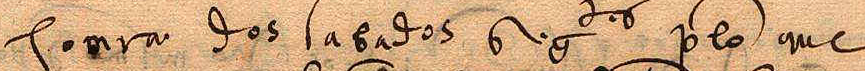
homra dos sabados segtes p̄lo que
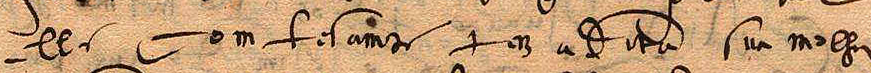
elle Comfesamte tem a d̄ita sua molher
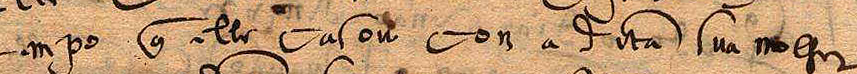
tempo q̄ elle casou com a dīta sua molher
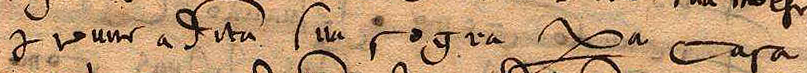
e trouue a d̄ita sua sogra ꝑa casa
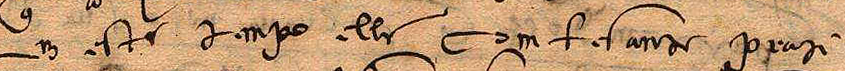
em este tempo elle comfesante prati
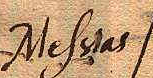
Messias /
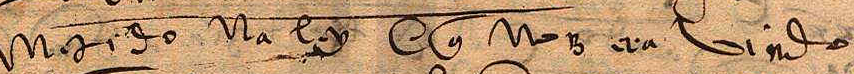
Metido Na ley e q̄ nom era vindo
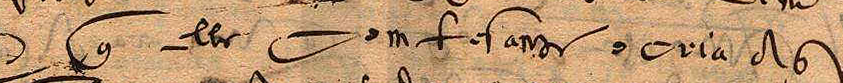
e q̄ elle comfesante o cria Asy
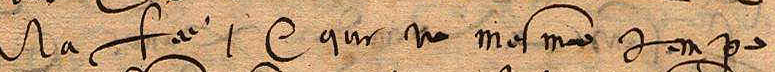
Na fee / e que no mesmo tempo
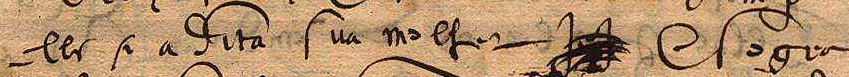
elle e a dīta sua molher JeJ e sogra
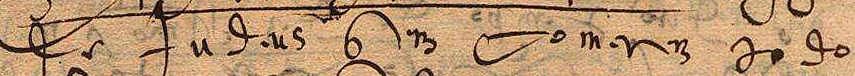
de Judeus sem comerem todo
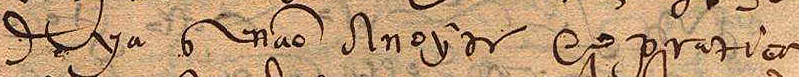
o dya senão A noyte e o pratica
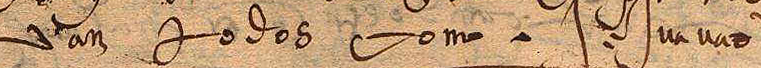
vam todos como o JeJuauão
